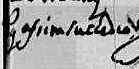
q̄ assim succedeo
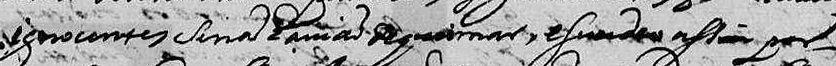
ignocentes se naõ hauiaõ de queimar, e sucedeo assim por
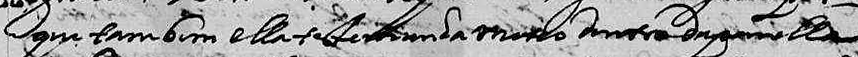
que tambem ella testemunha meteo dentro da panella
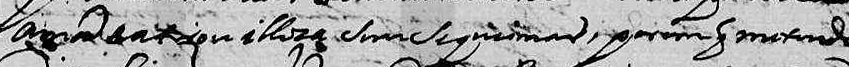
a mā e a tirou illeza sem se queimar, porem q̄ metendo
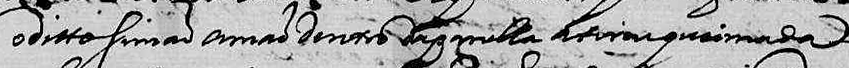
o ditto simaõ a maõ dentro da panella a tirou queimada
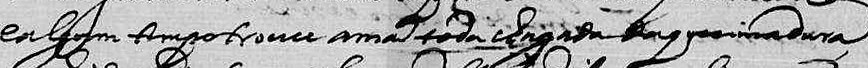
e algum tempo trouce a maõ toda chagada da queimadura,
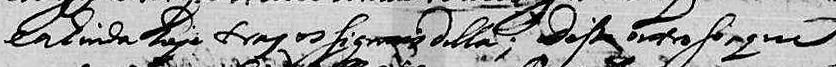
e ahinda hoje tras os signais della; disse outrosi que
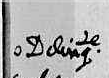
o Delinqte.
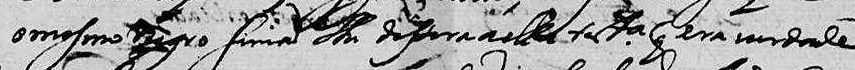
o mesmo negro simā lhe dissera a elle test.a q̄ era uerdade
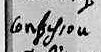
confessou
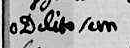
o Delito sem
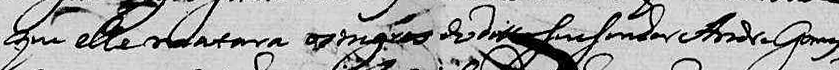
que elle matara os negros do ditto seu senhor Andre Gomes,
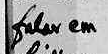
falar em
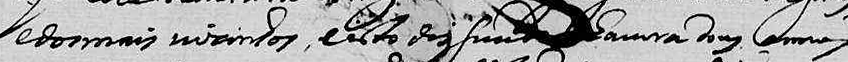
e dos mais uizinhos, e isto dis sucedeo hauera dous annos
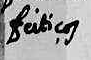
feitiços
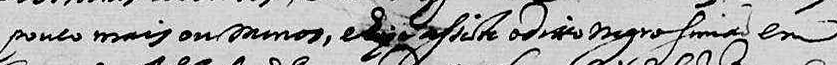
pouco mais ou menos, e hoje assiste o ditto negro simaõ em
